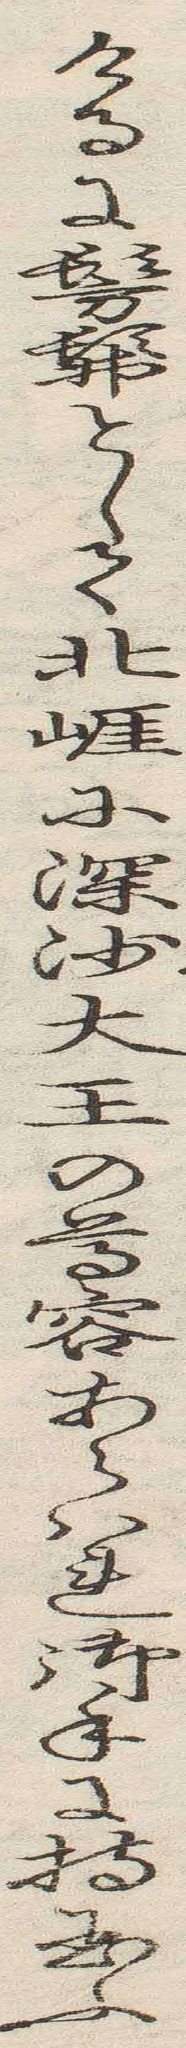けるに髣髴として北崕に深沙大王の尊容あらはれ御手に持玉ふ
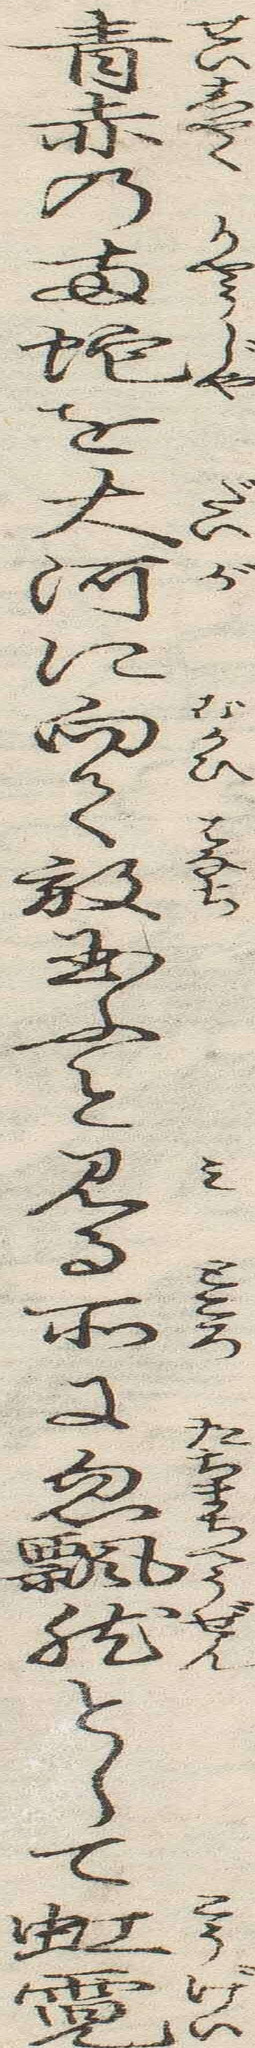青赤の両蛇を大河に向て放玉ふと見る所に忽飄然として虹霓
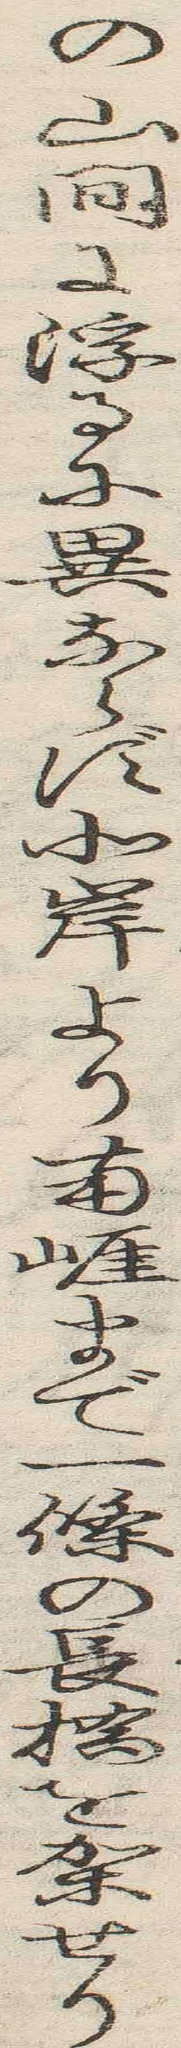の山間に浮るに異ならず北岸より南崕まで一條の長橋を架せり
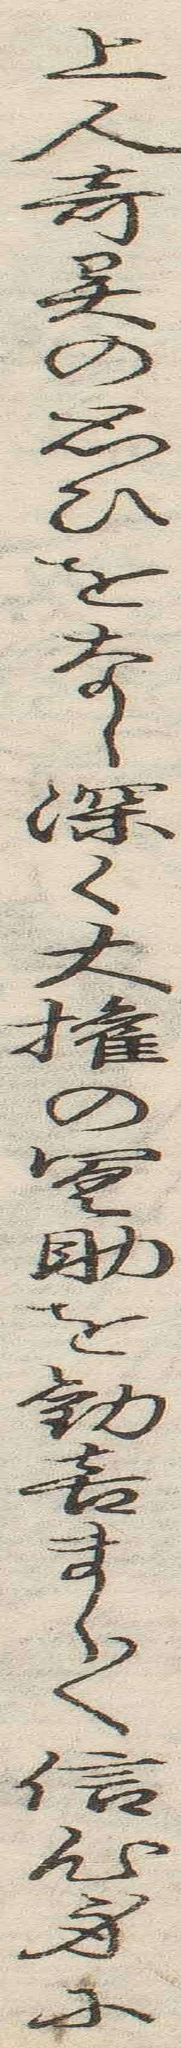上人奇異の思ひをなし深く大権の冥助を歓喜まし〳〵信心身に
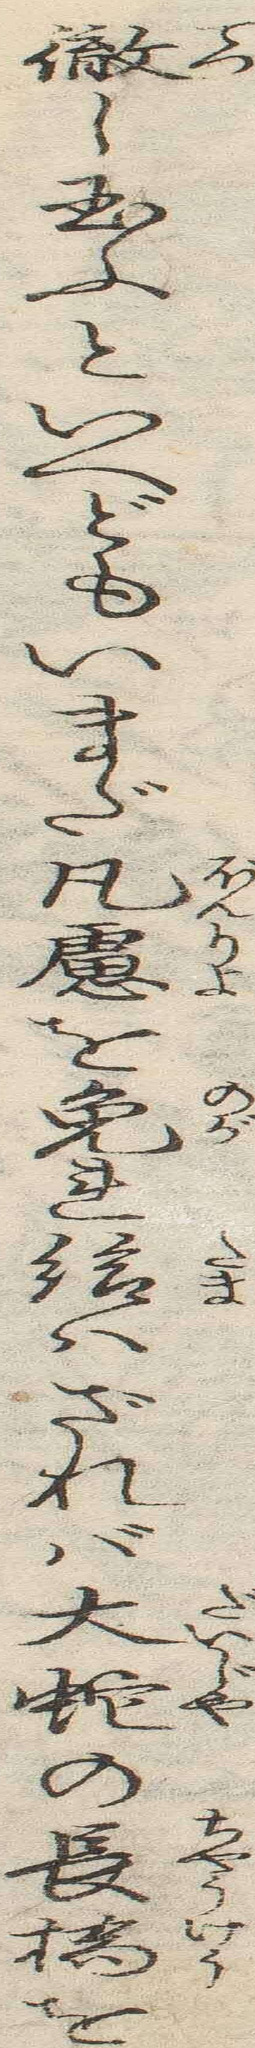徹し玉ふといへどもいまだ凡慮を免れ給はざれば大蛇の長橋を
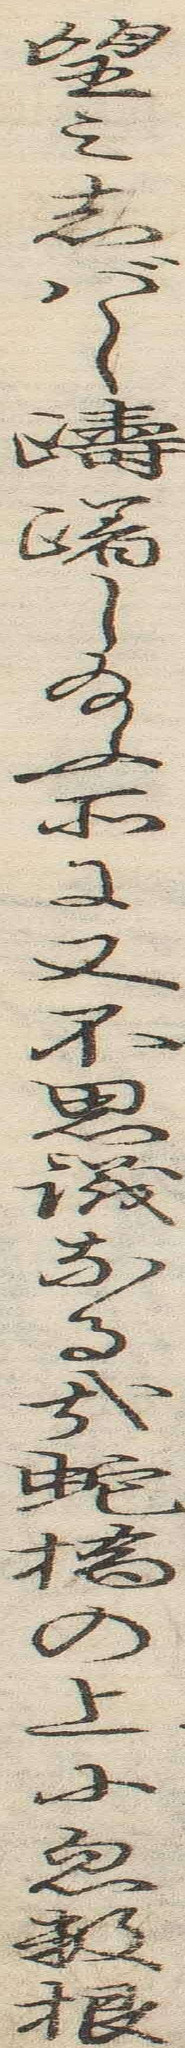望みしばし躊躇し給ふ所に又不思議なる哉蛇橋の上に忽数根
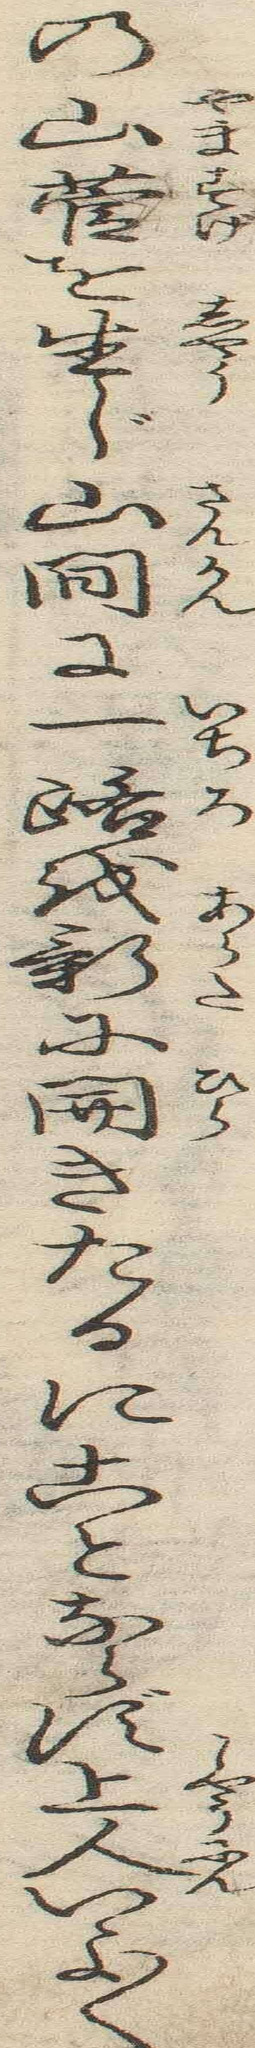の山菅を生じ山間に一路を新に開きたるにことならず上人いよ〳〵

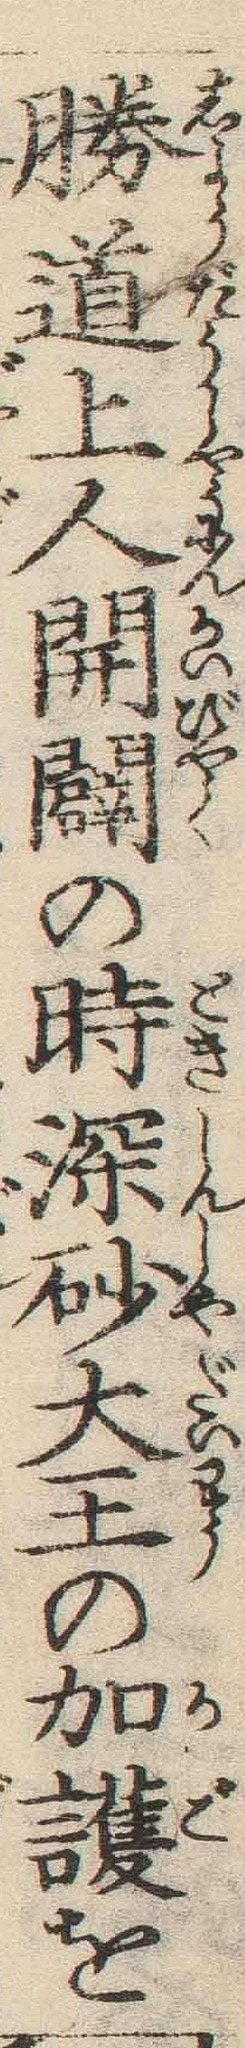勝道上人開闢の時深沙大王の加護を
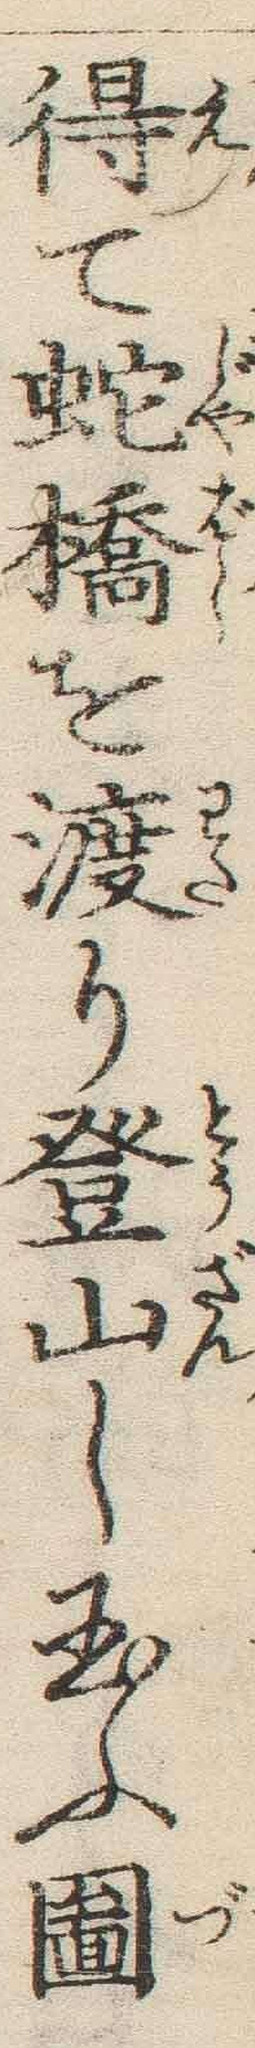得て蛇橋を渡り登山し玉ふ圖

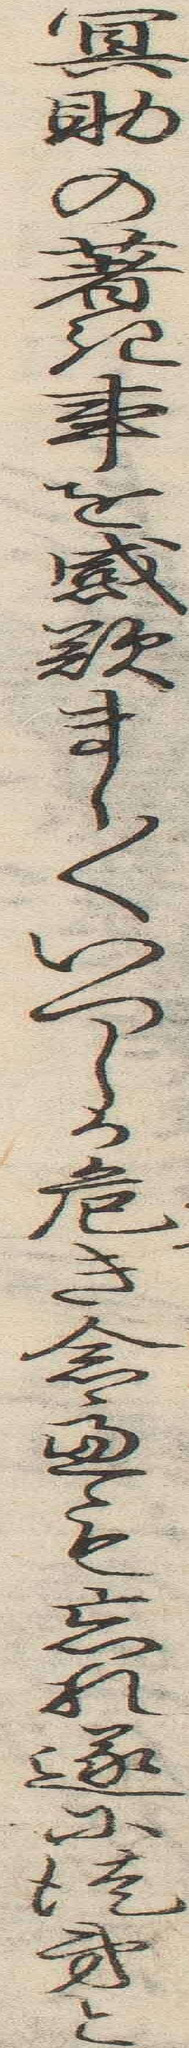冥助の著き事を感歎まし〳〵いつしか危き念慮も忘れ遂に徒㐧と
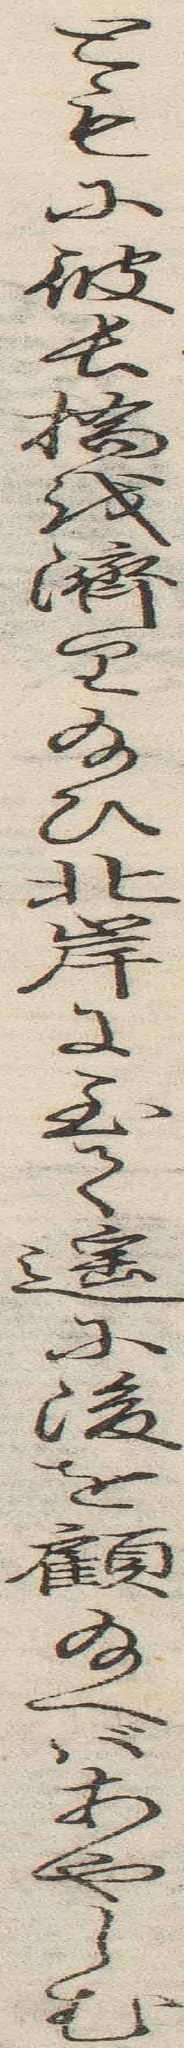ともに彼長橋を濟り給ひ北岸に至て遥に後を顧給へばあやしむ
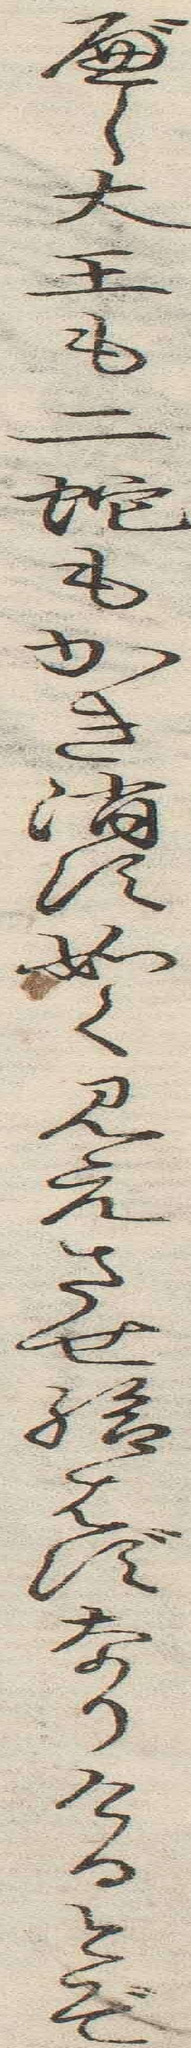べし大王も二蛇もかき消す如く見えさせ給はずなりけるとぞ
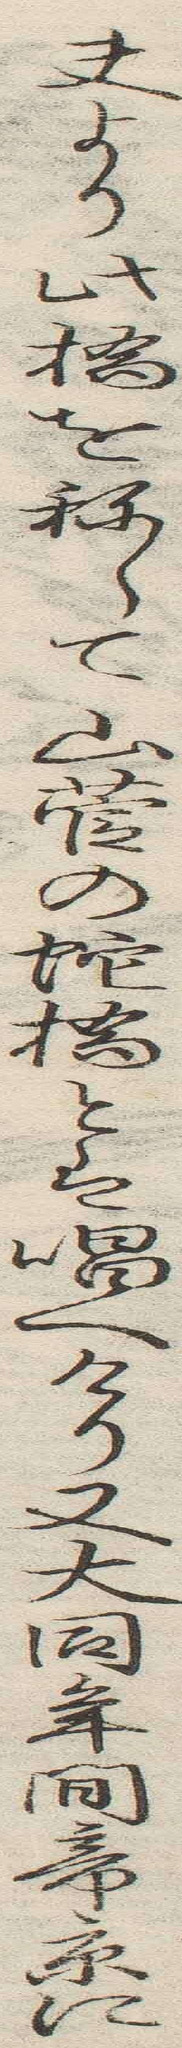夫より此橋を称して山菅の蛇橋とは唱へけり又大同年間帝京に
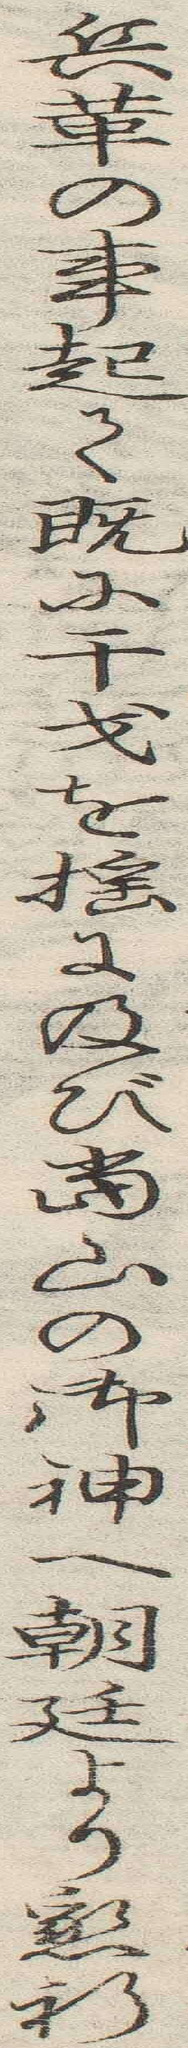兵革の事起て既に干戈を揺に及び當山の御神へ朝廷より懇祈
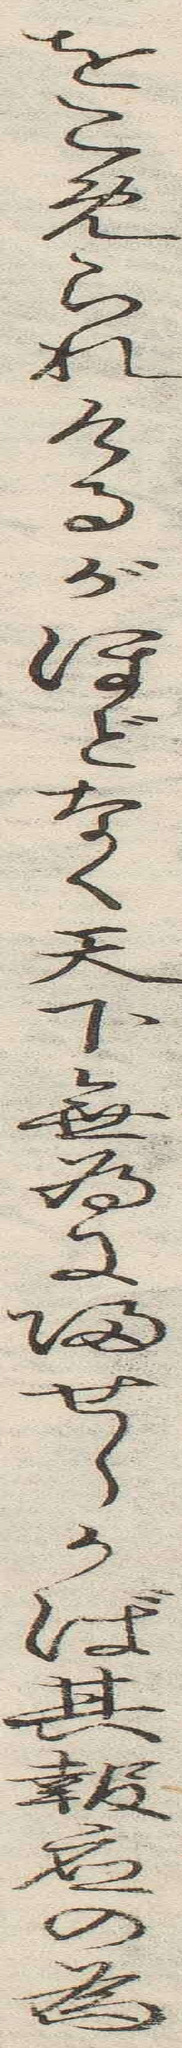をこめられけるがほどなく天下無為に帰せしかば其報應の為
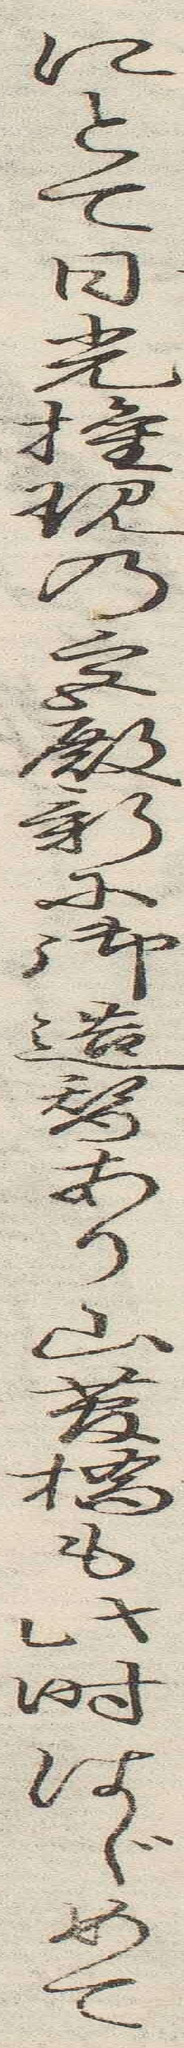にとて日光權現の宮殿新に御造替あり山菅橋も此时はじめて
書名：日光山志
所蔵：東京学芸大学附属図書館 国文学研究資料館
